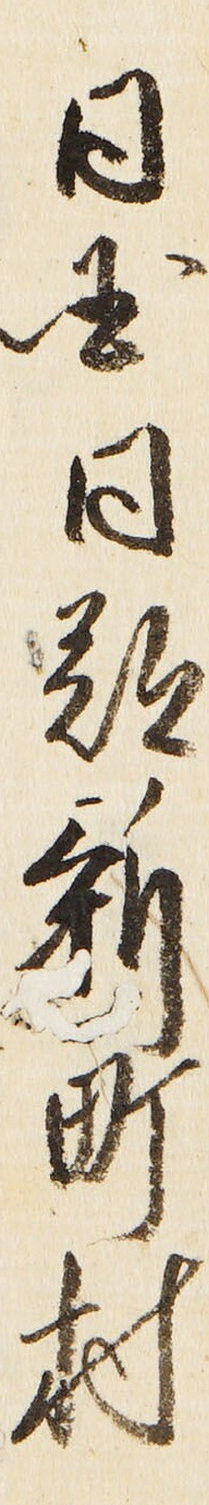同国同領新町村
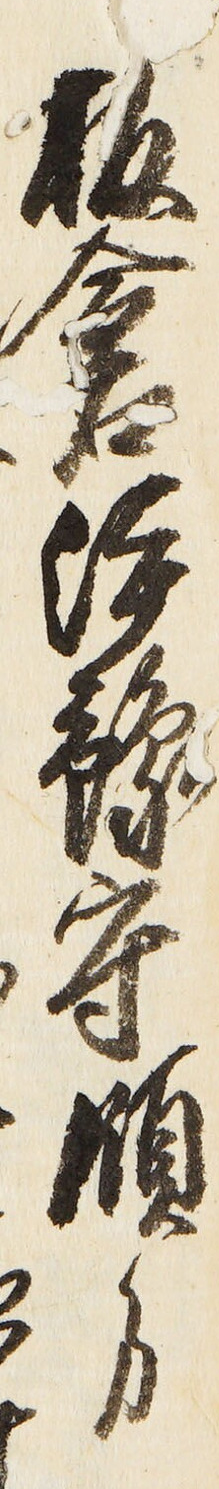板倉伊予守領分
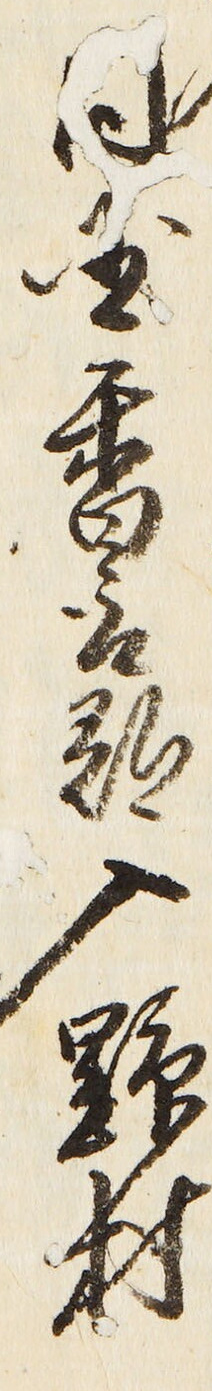同国香取郡入野村
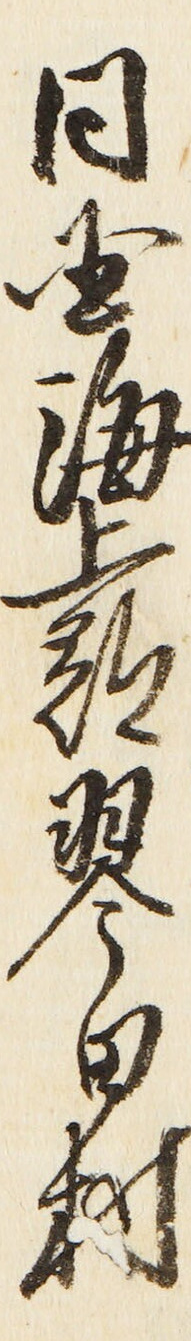同国海上郡琴田村

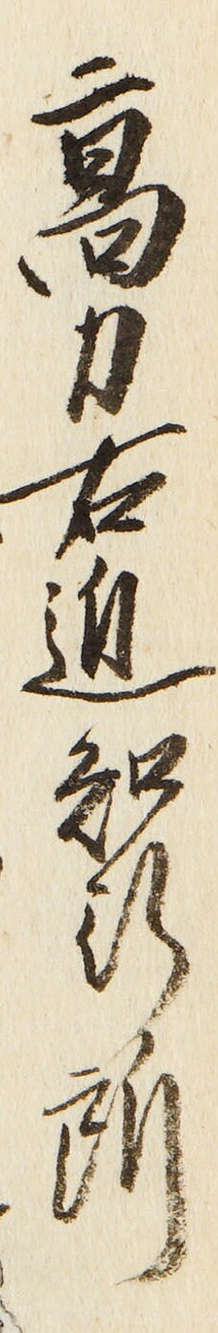高力右近知行所
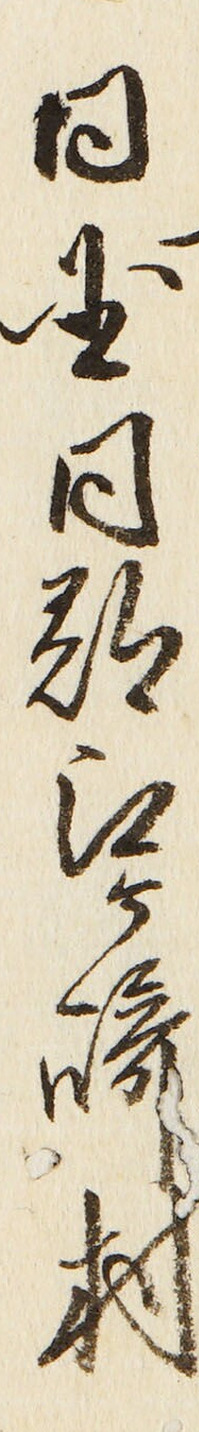同国同郡江ケ崎村
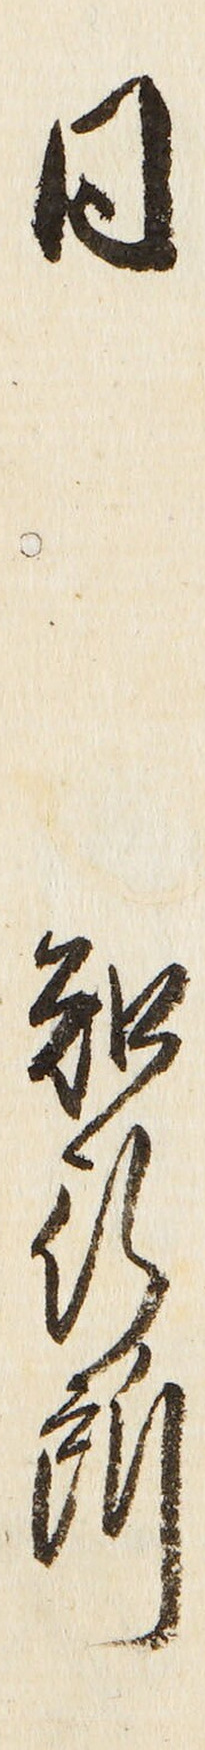同知行所
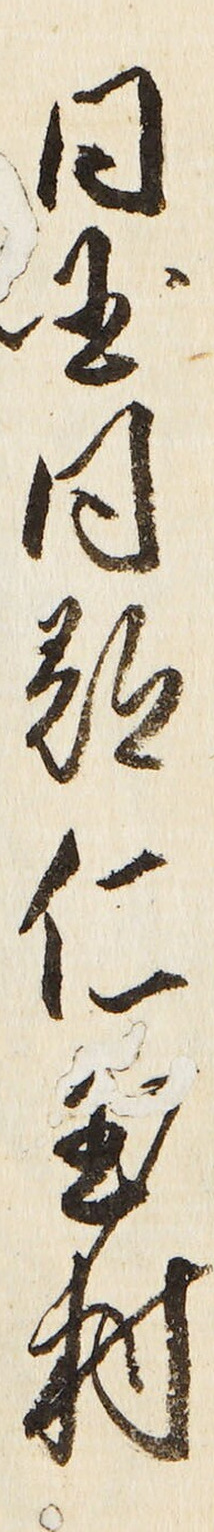同国同郡仁玉村
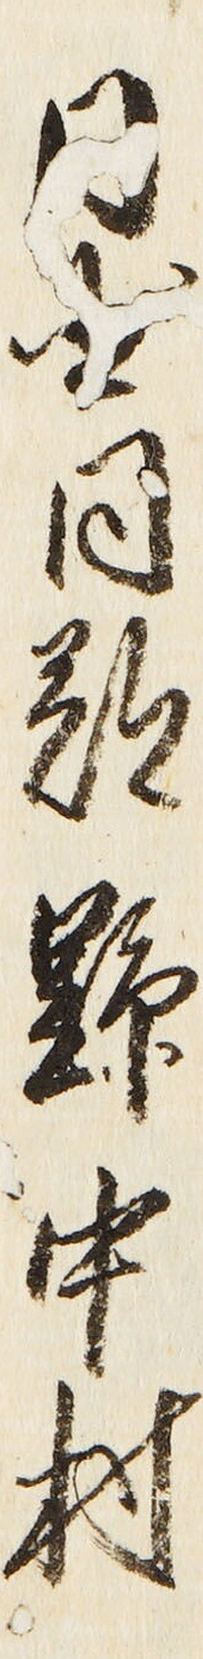同国同郡野中村
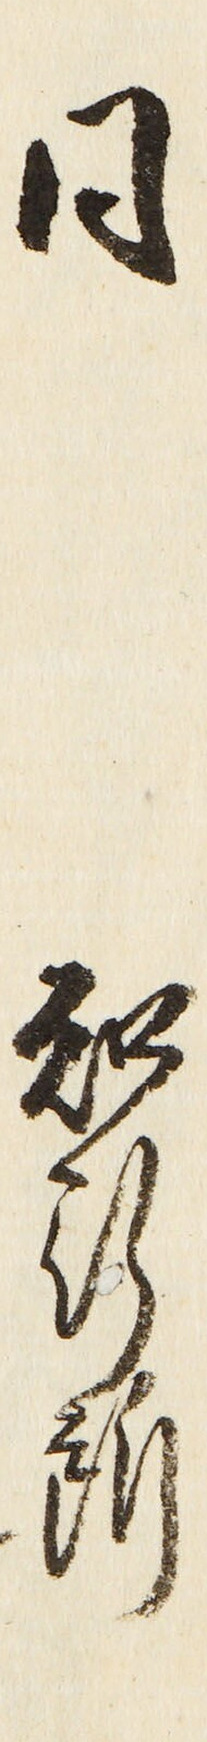同知行所
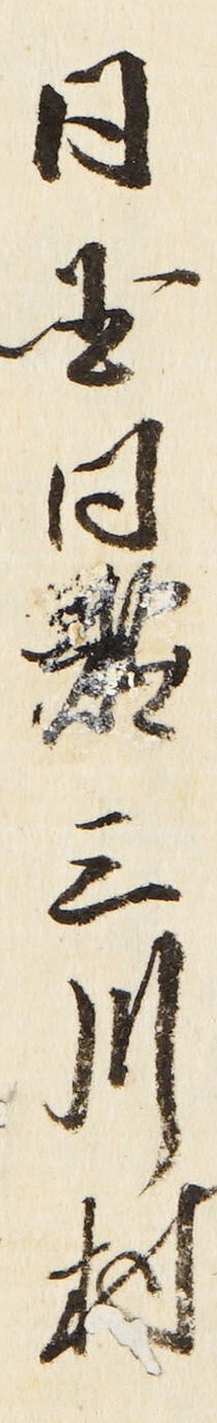同国同郡三川村

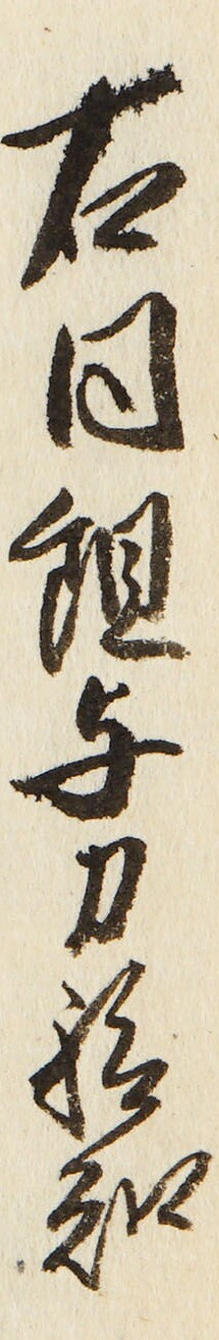右同組与力給知
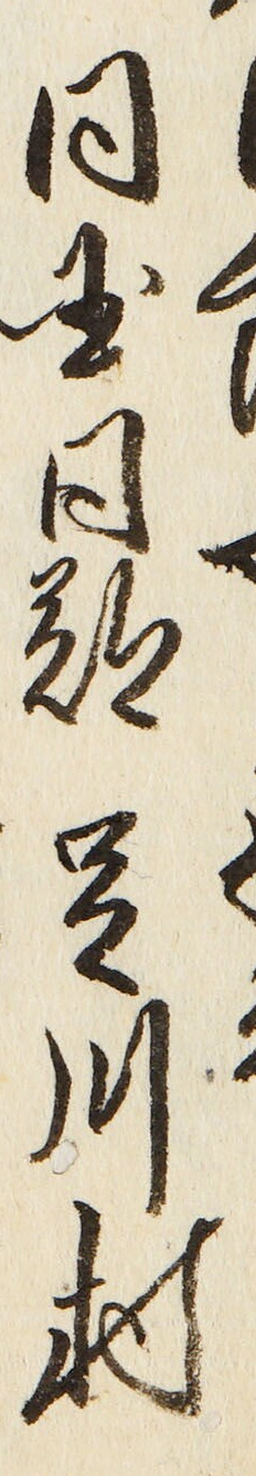同国同郡足川村
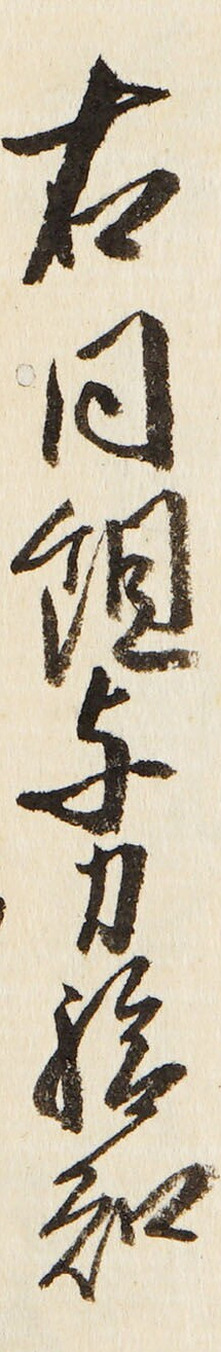右同組与力給知
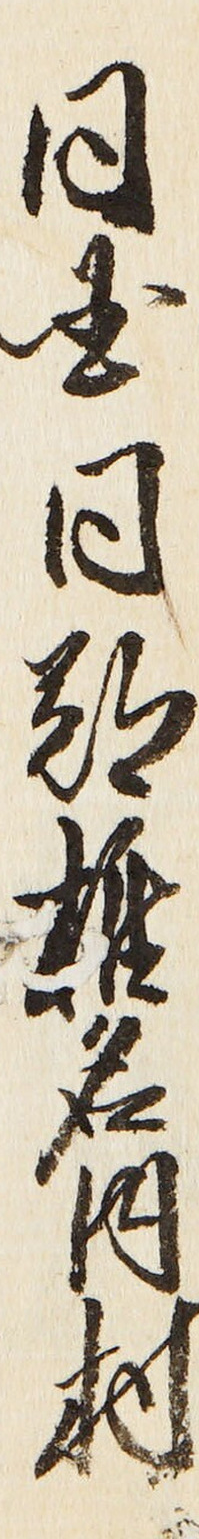同国同郡椎名内村
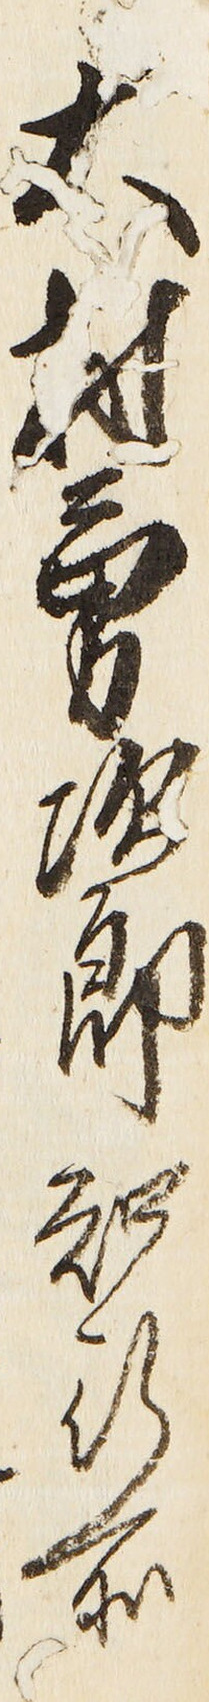大村勇次郎知行所
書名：難船一件記録
